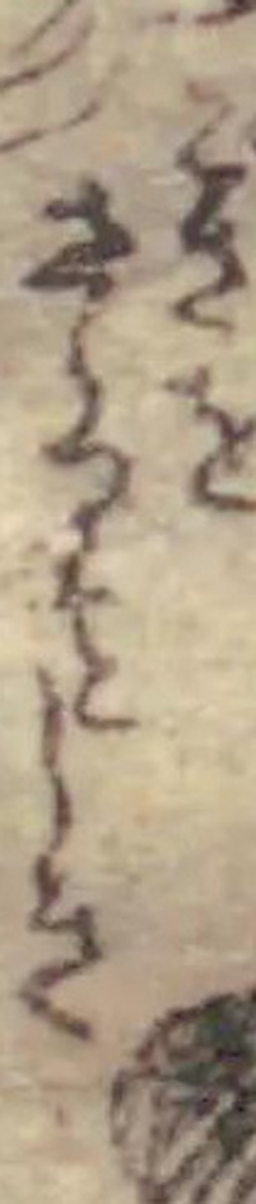さらりとしき
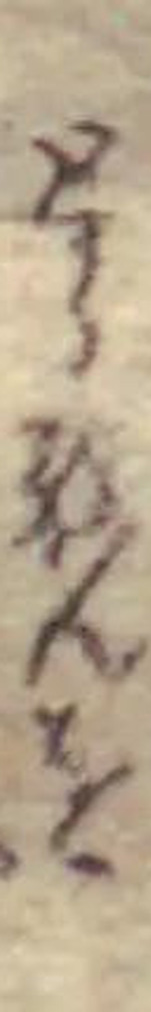とうねんを
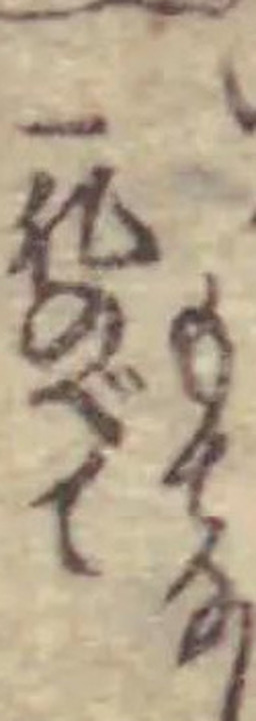一礼のべて
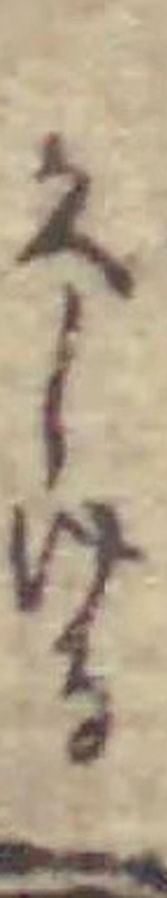かへしける

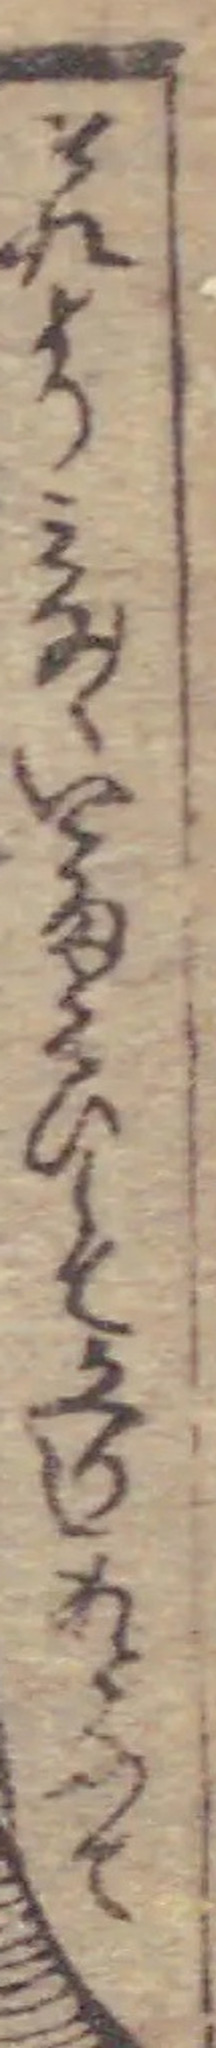それよりみな〳〵いとまこひしてかへりしあとにて
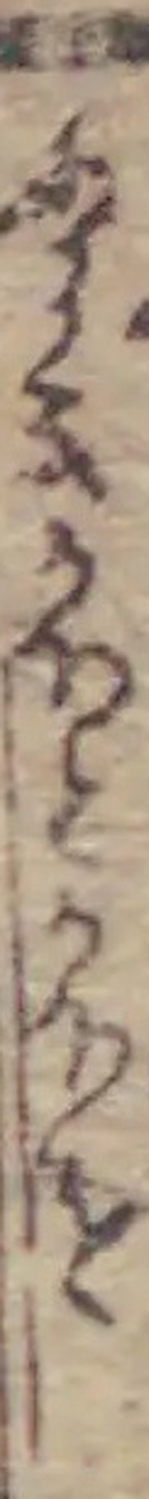にかきかほとかほを
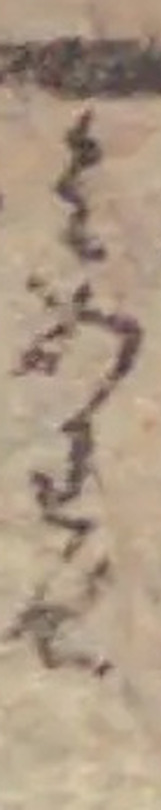みあわせ
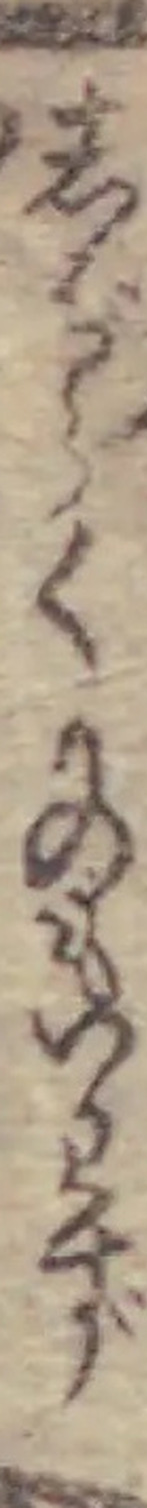しばらくものもいわず
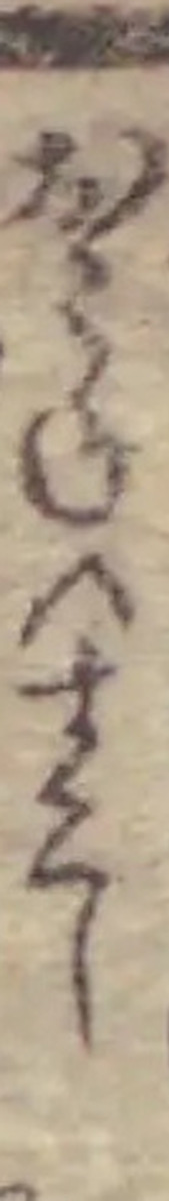おみねはすこし
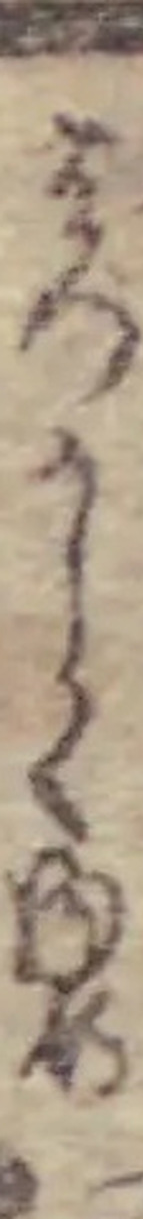はつかしくゆめ
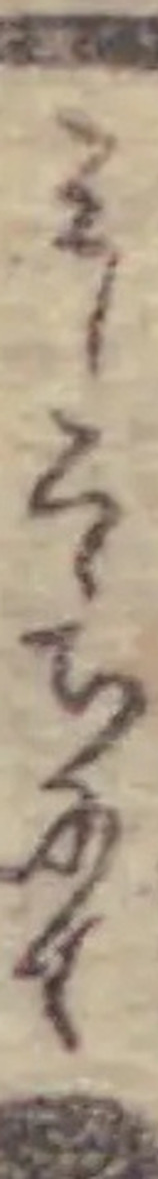みしこゝちにて
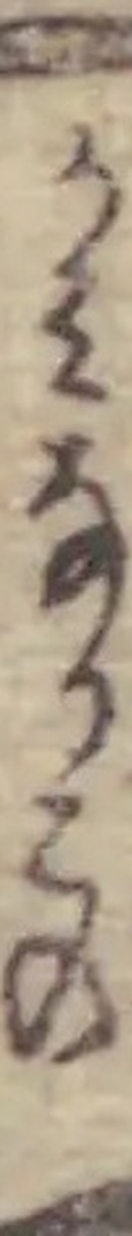かみなりこの
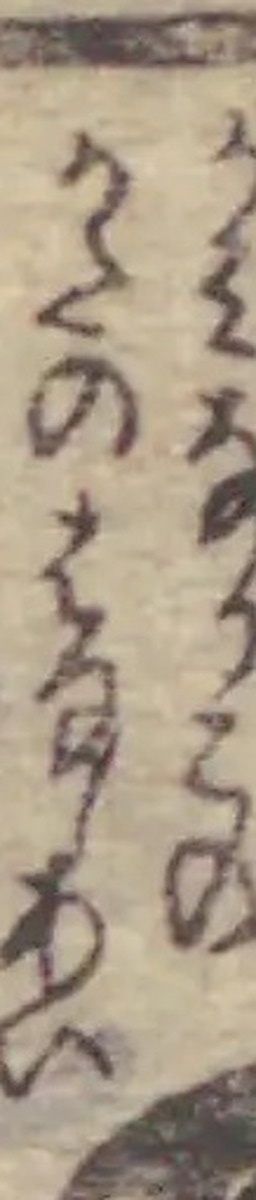かたのはなしあい
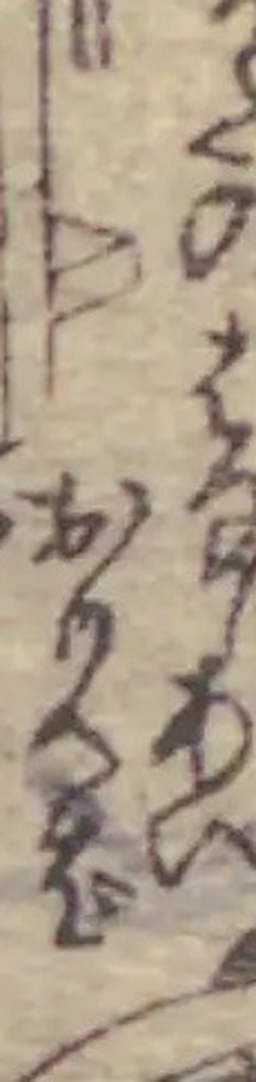おもへば
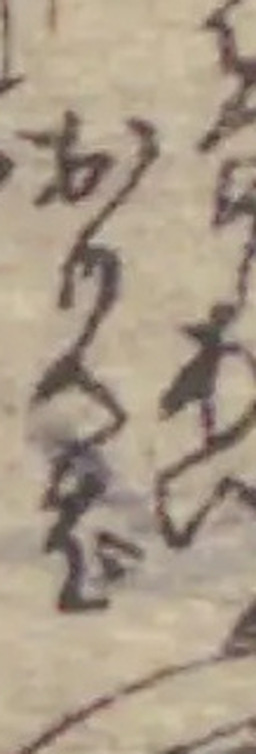おもへば
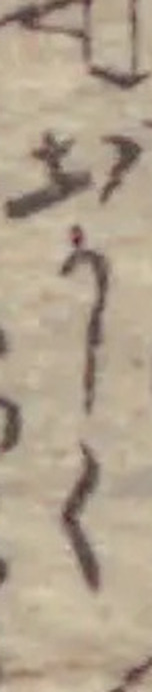おかしく
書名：飛た間違矢口噂 2巻
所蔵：国立国会図書館 National Diet Library, JAPAN
